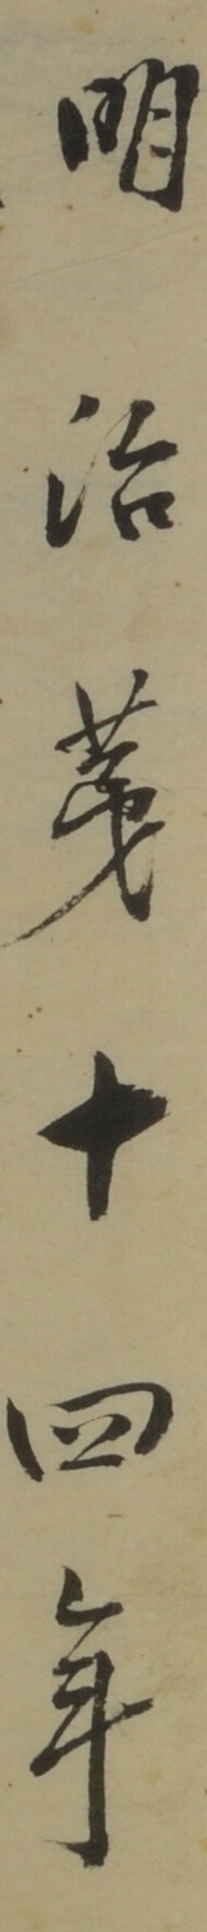明治第十四年
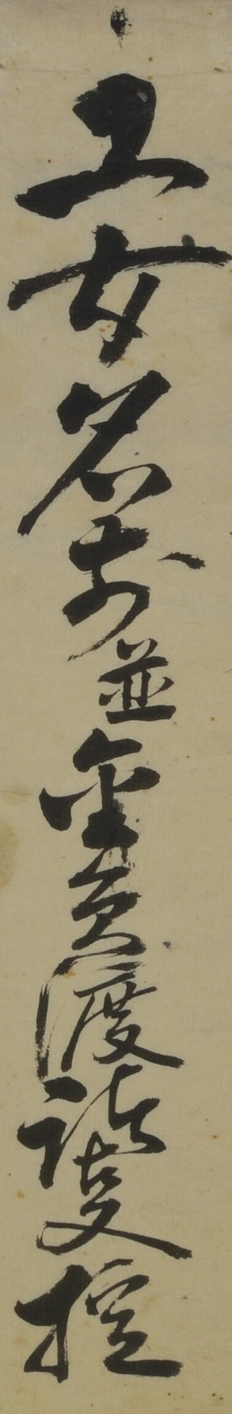工女名前並金員渡諸事控
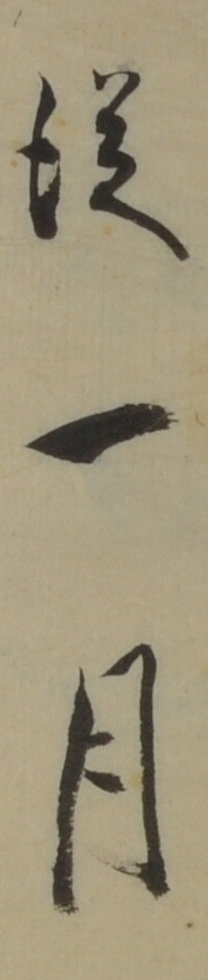従一月

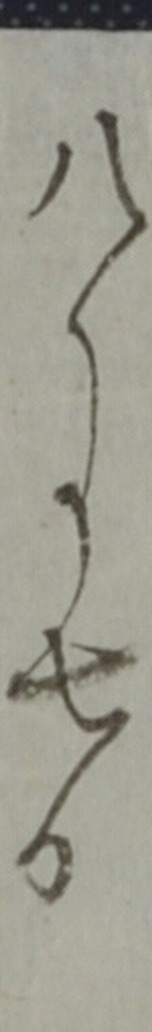八月七日
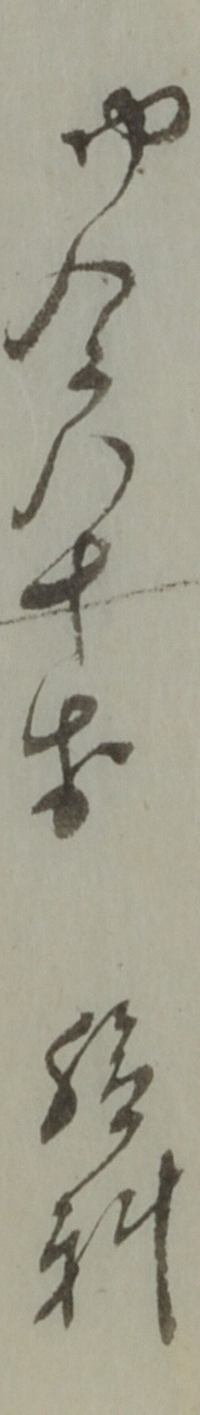巾金八十銭給料
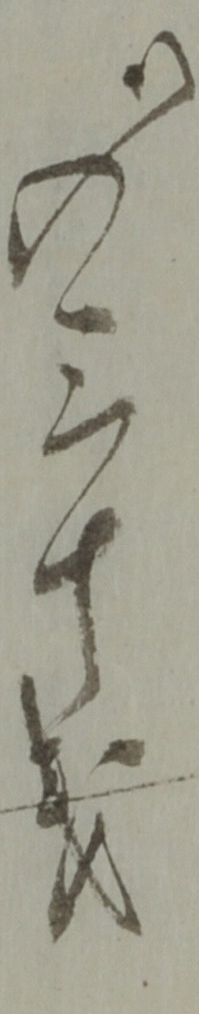〆三十銭

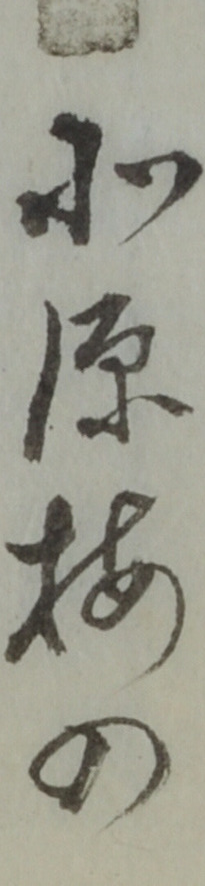㊞北原梅の
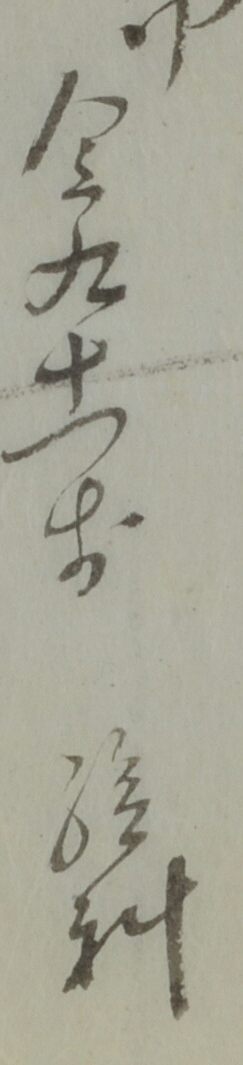金九十一銭給料
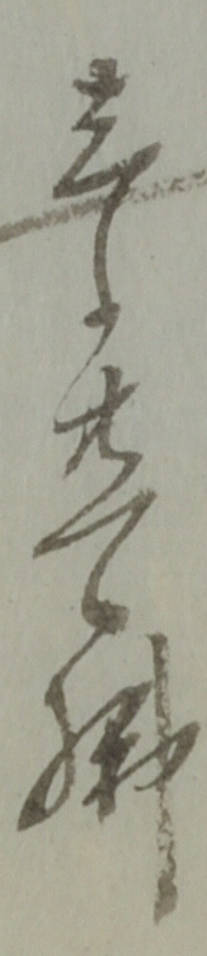三月廿一日払
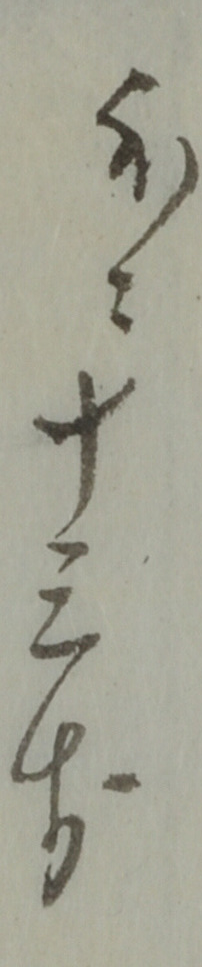外ニ十三銭
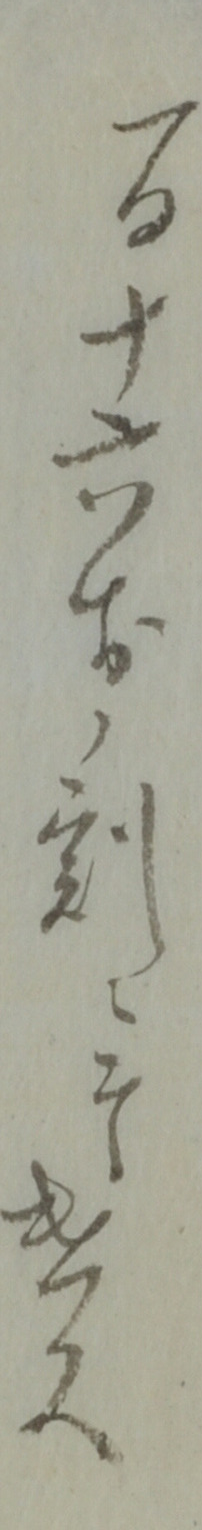百十六銭ノ割ニテ遺ス

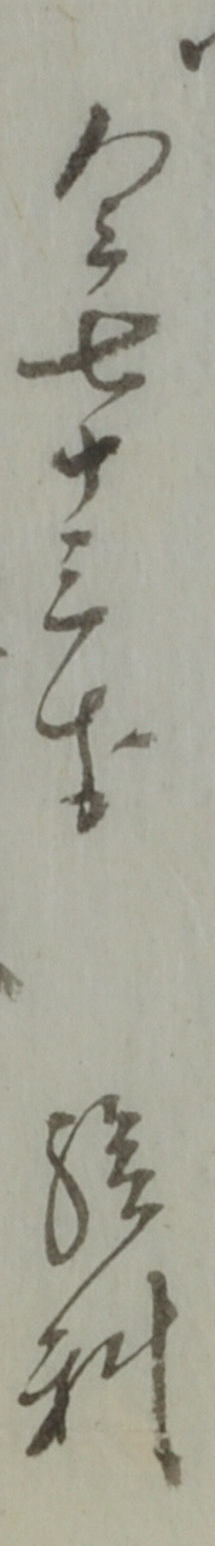金七十三銭給料
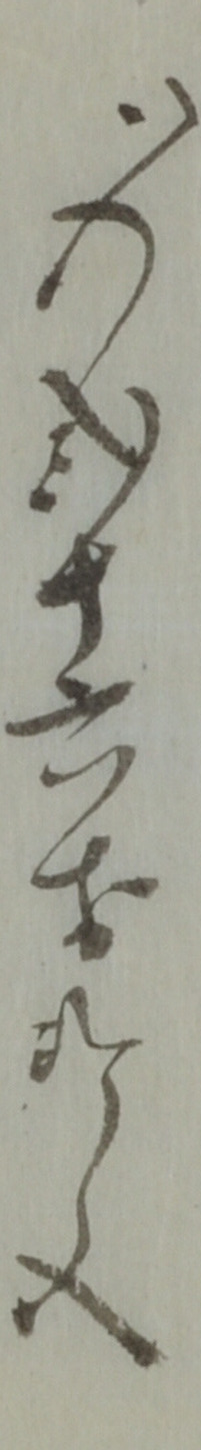同〆弐十六銭弐文

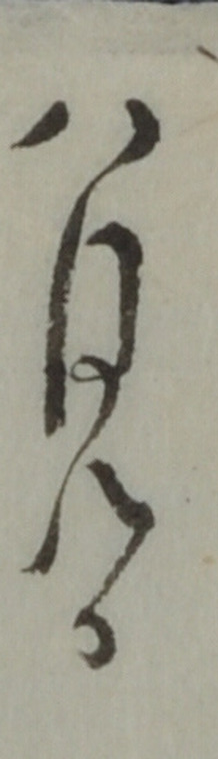八月八日

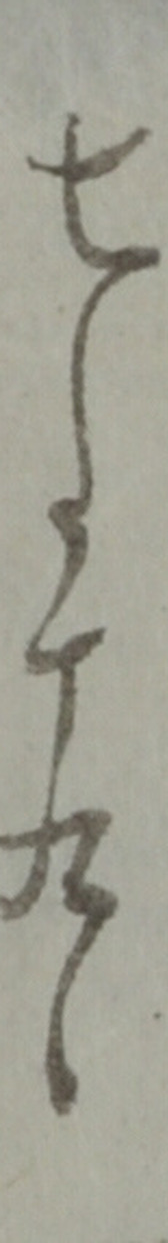七月十九日
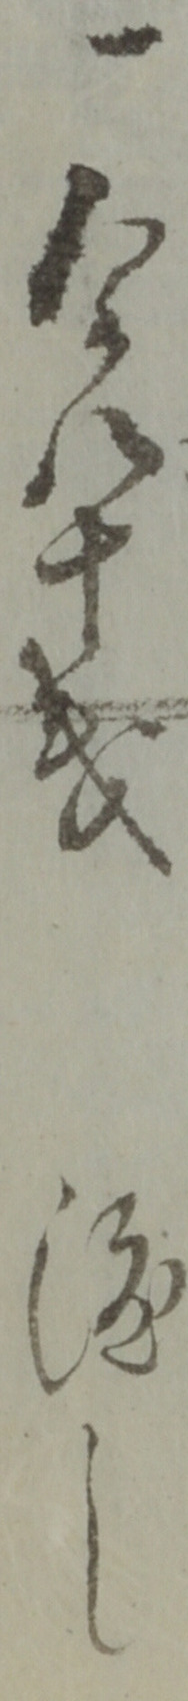一金八十銭渡し
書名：工女名前並金員渡諸事控
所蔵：伊那市立高遠町図書館・合同会社AMANE
